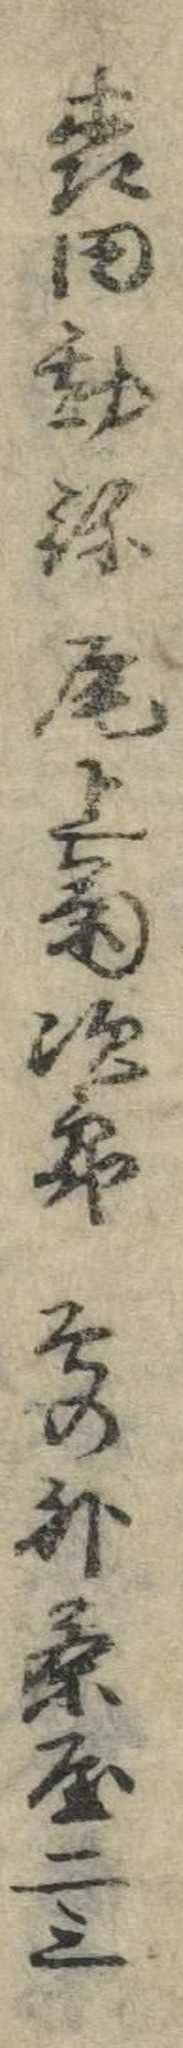森田勘彌尾上菊次郎その外茶屋二三
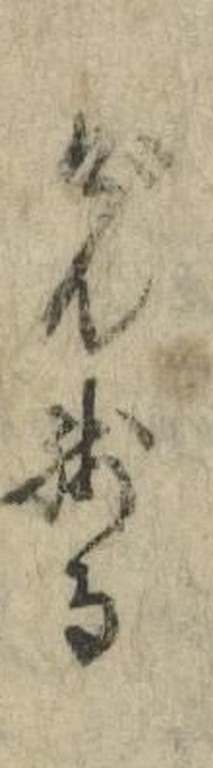けん残る
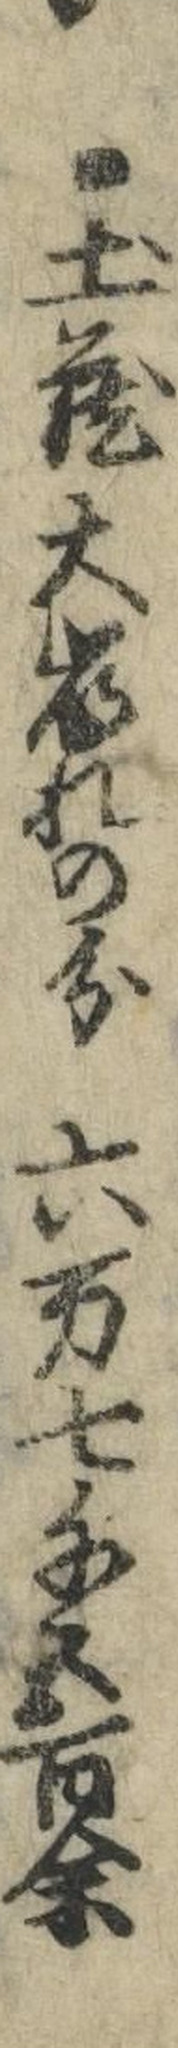●土蔵大崩れの分六万七千五百余
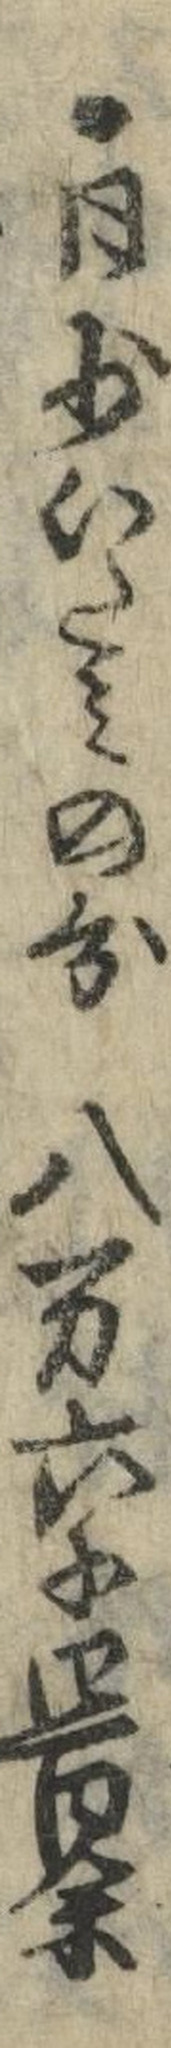●同少いたミの分八万六千四百余
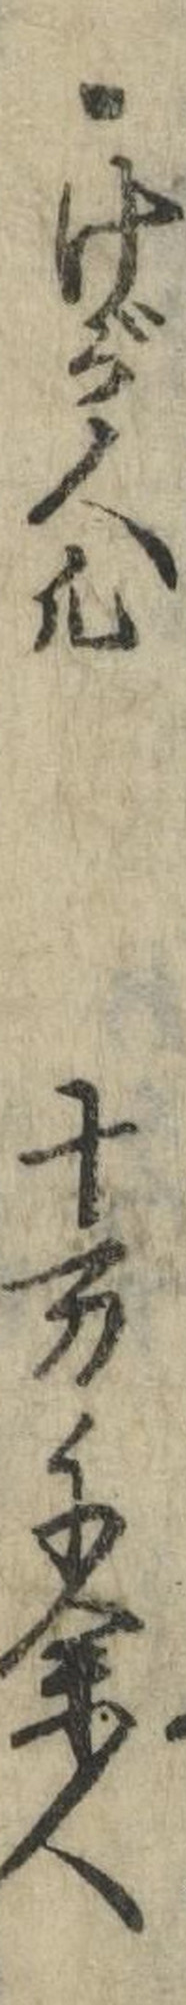●けが人凡十万千余人
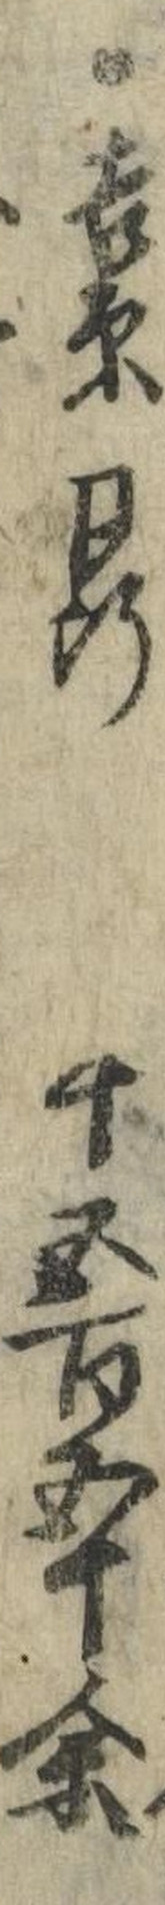●吉原同断千五百五十余
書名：安政二卯十月二日夜四ツ時過　御府内御屋敷方市中共　地震類焼場所明細書之寫　并街道筋近郷聞書
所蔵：東京大学地震研究所図書室 Earthquake Research Institute Library, The University of Tokyo, JAPAN
